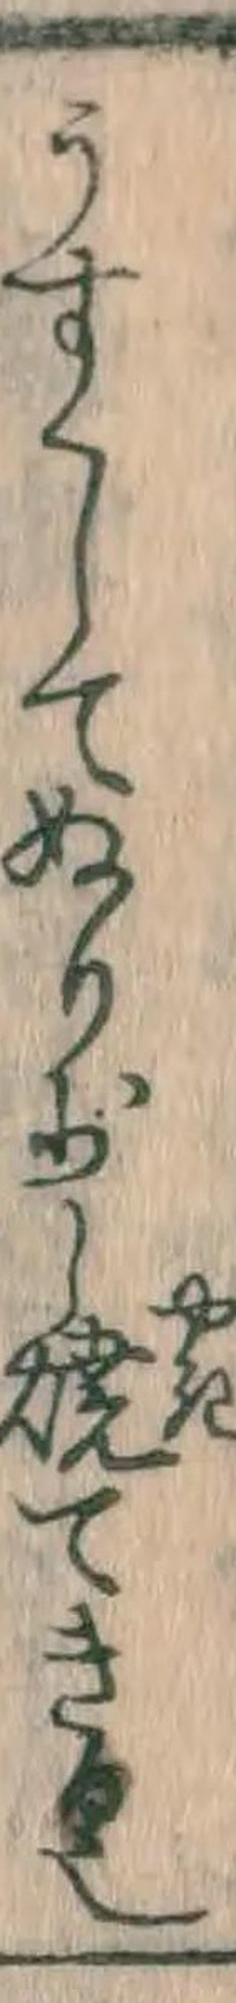うすくしてぬり少し焼てきる也
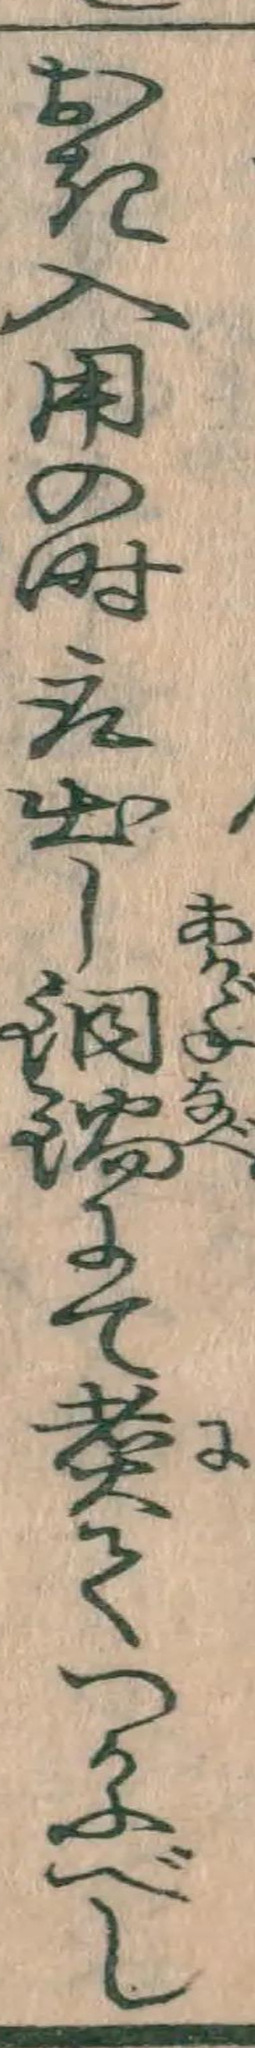おき入用の時取出し銅鍋にて煮てつかふべし
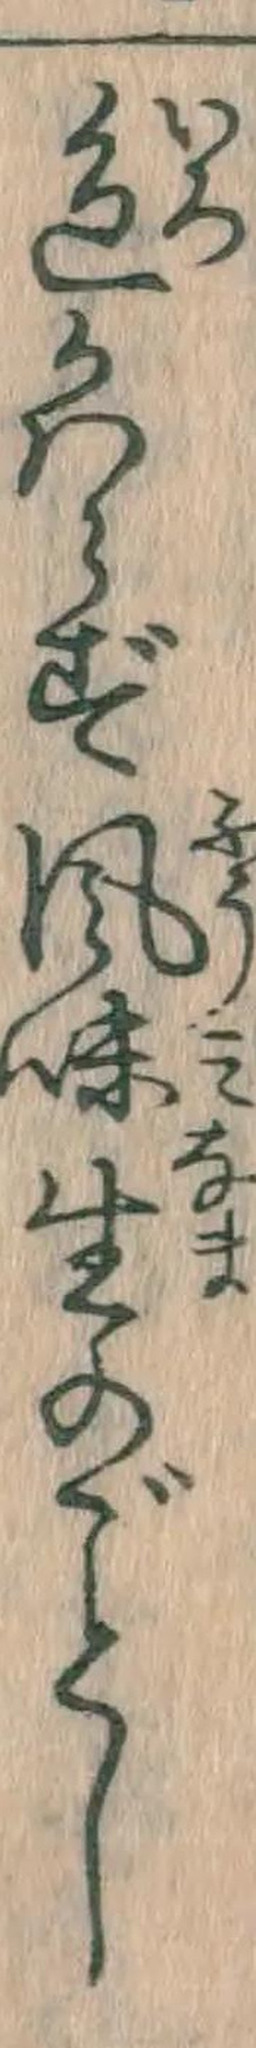色かはらず風味生のごとし
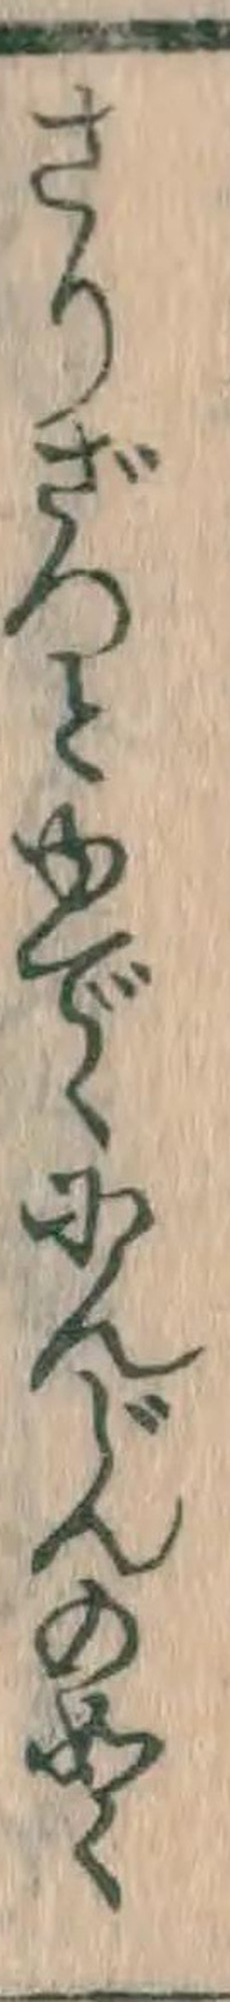きりざつとゆでゝにんじんの如く
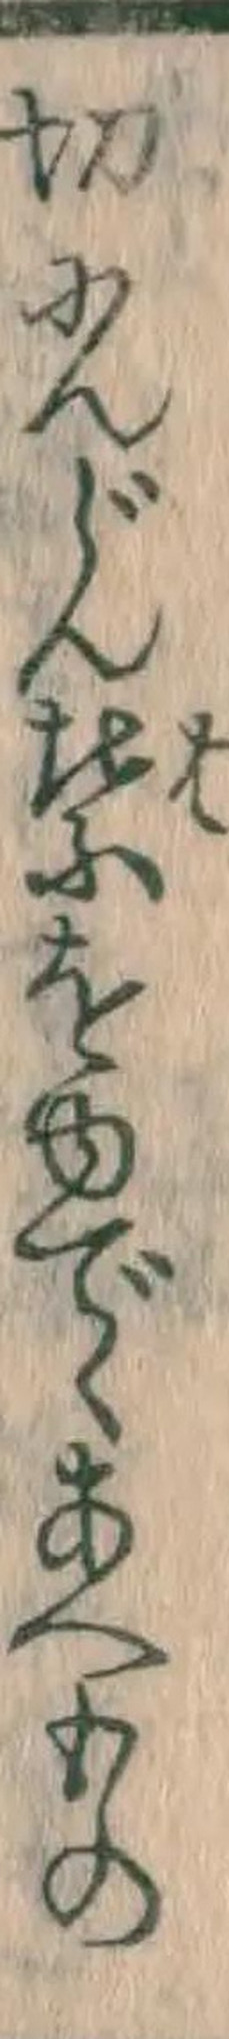切にんじん葉をゆでゝあへもの
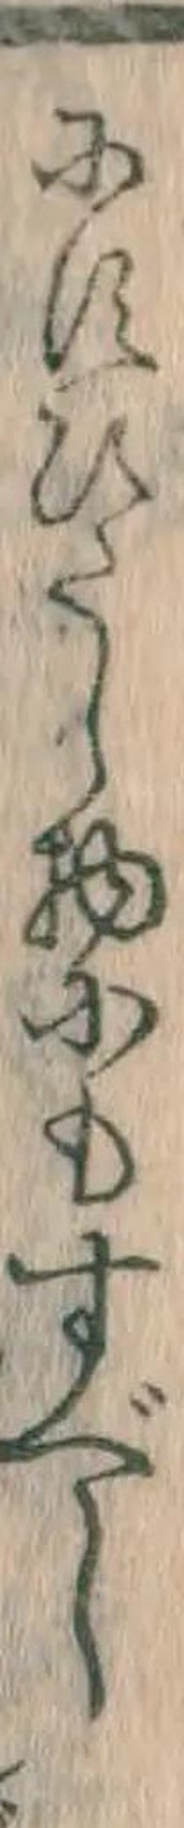にすひたし物にもすべし
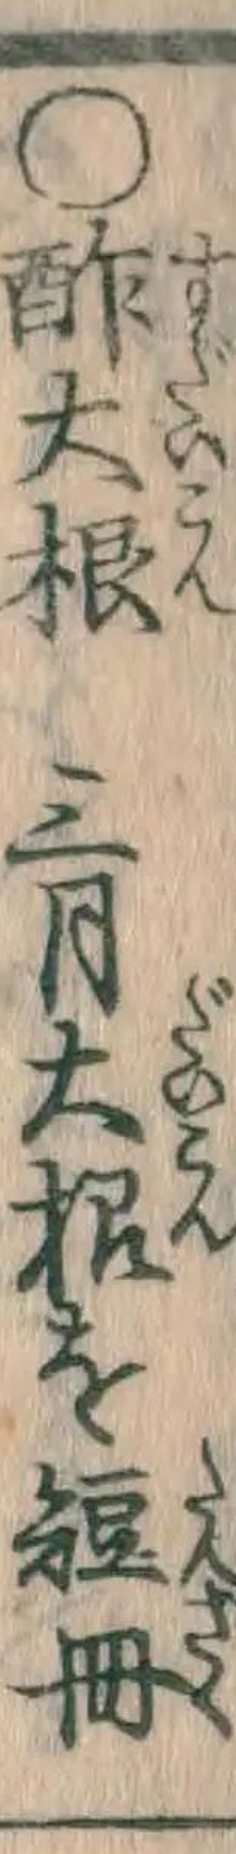○酢大根三月大根を短冊
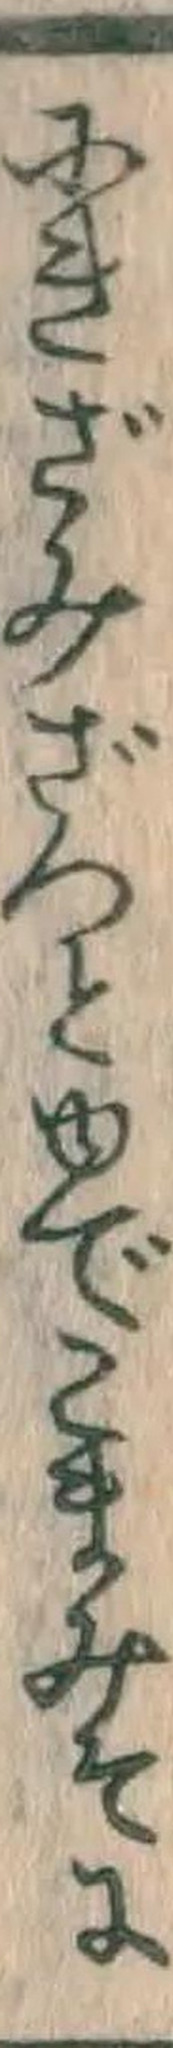にきざみざつとゆでこまみそに
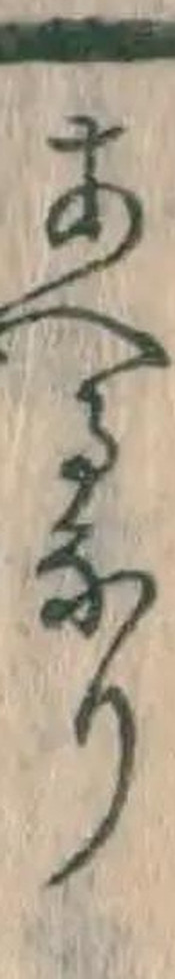あへるなり
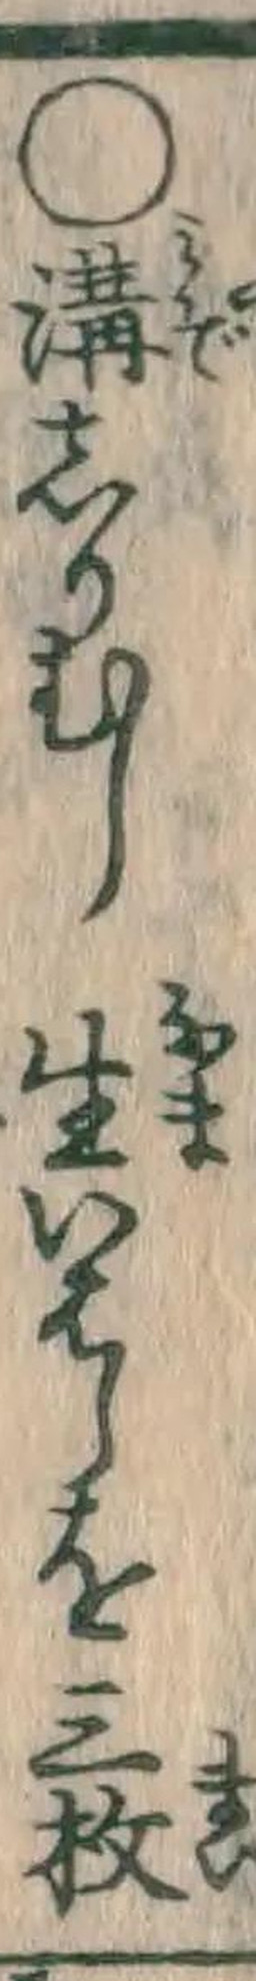○溝しりむし生いはしを三枚
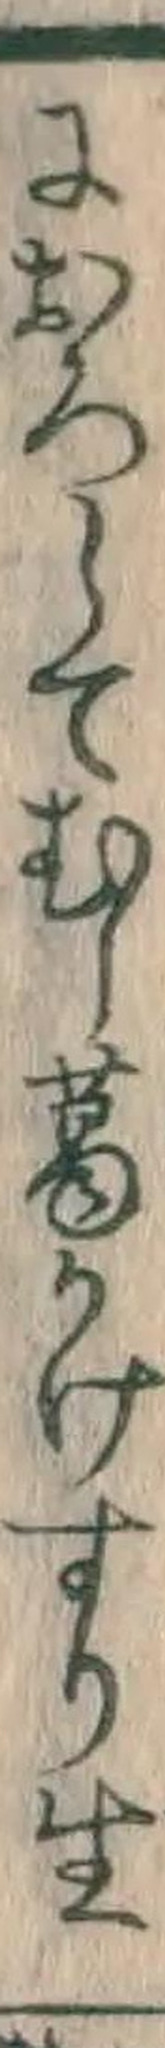におろしてむし葛かけすり生
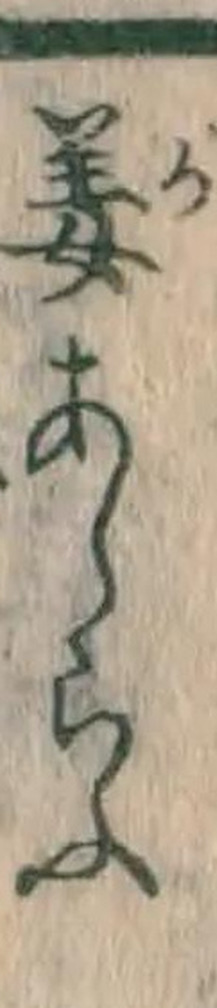姜あしらふ
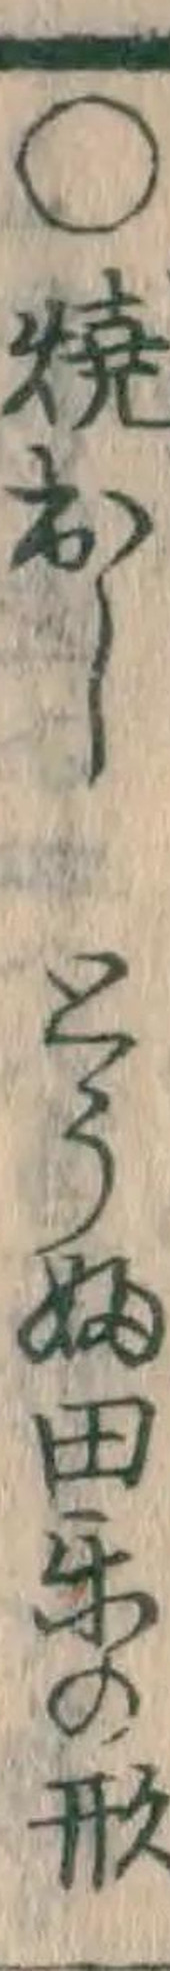○焼出しとうふ田楽の形
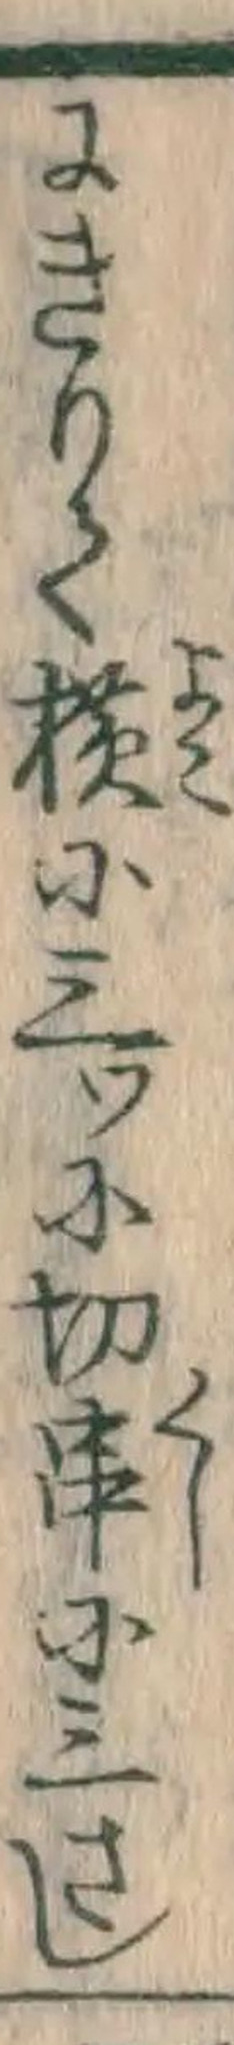にきりて横に三ッに切串に三さし

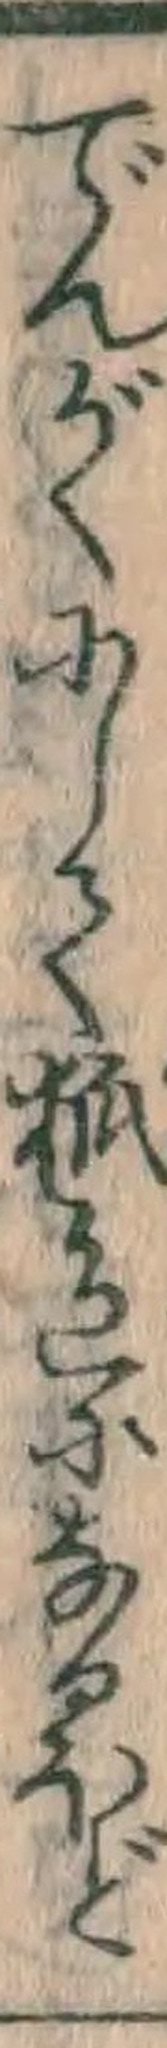でんがくにして狐色になるほど
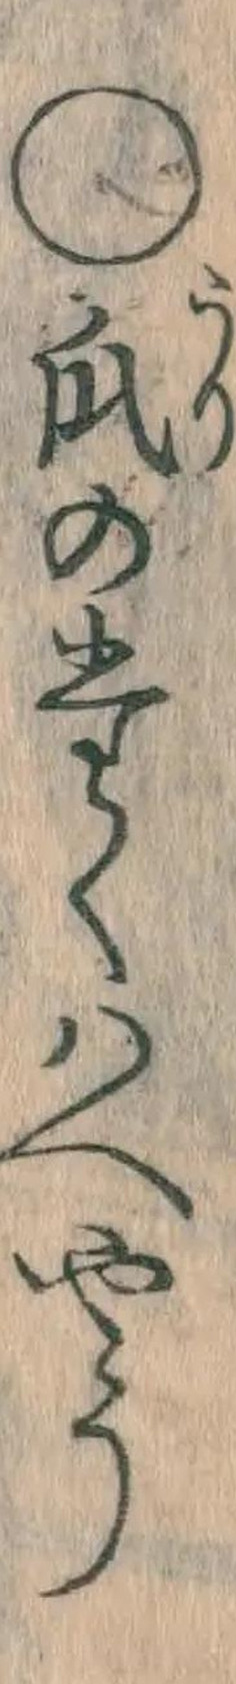○瓜のたくはへやう
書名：広益秘事大全 3巻. [5]
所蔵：国立国会図書館 National Diet Library, JAPAN
